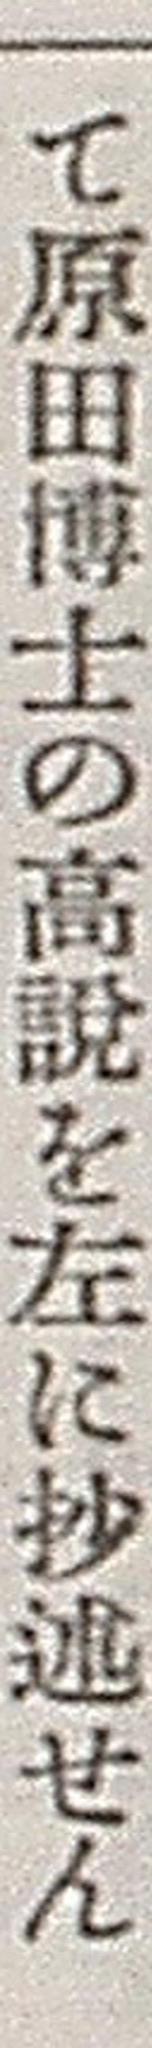て原田博士の高説を左に抄述せん
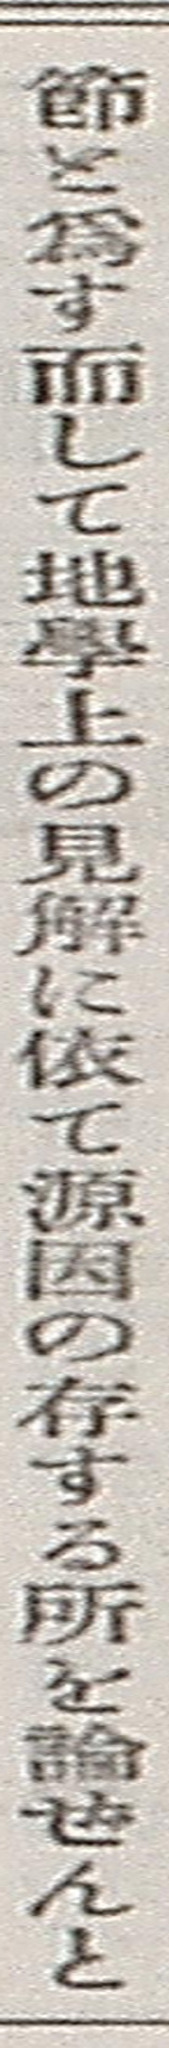節と為す而して地学上の見解に依て源因の存する所を論ぜんと
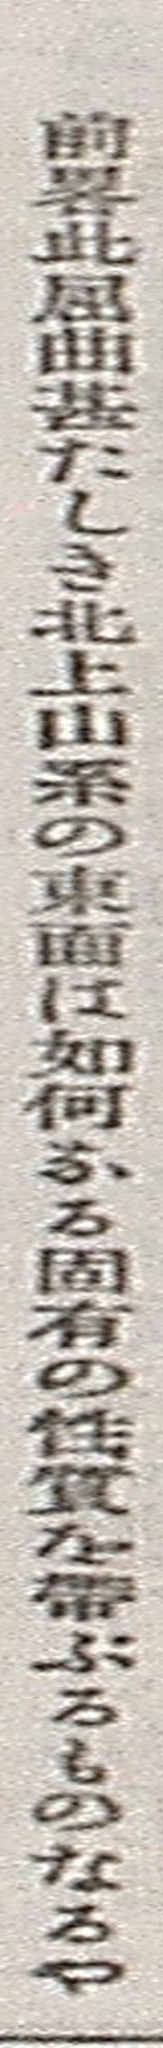前略此屈曲甚たしき北上山系の東面は如何なる固有の性質を帯ぶるものなるや
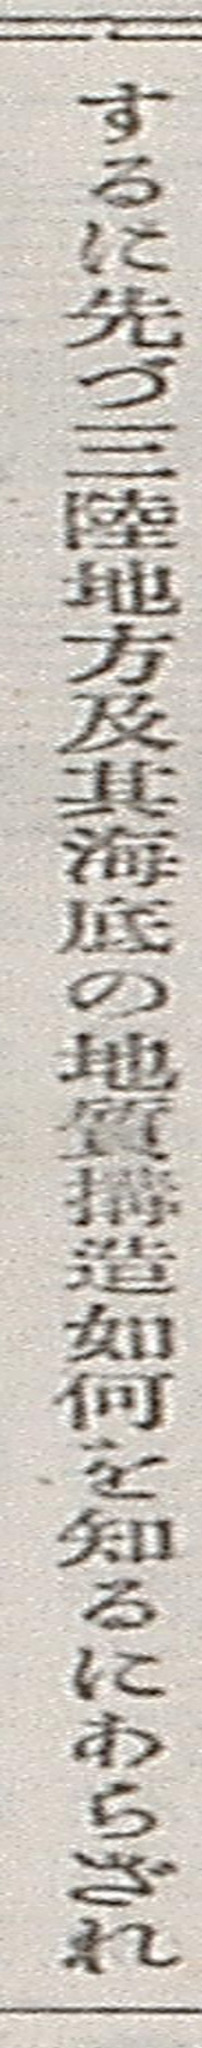するに先づ三陸地方及其海底の地質構造如何を知るにあらざれ
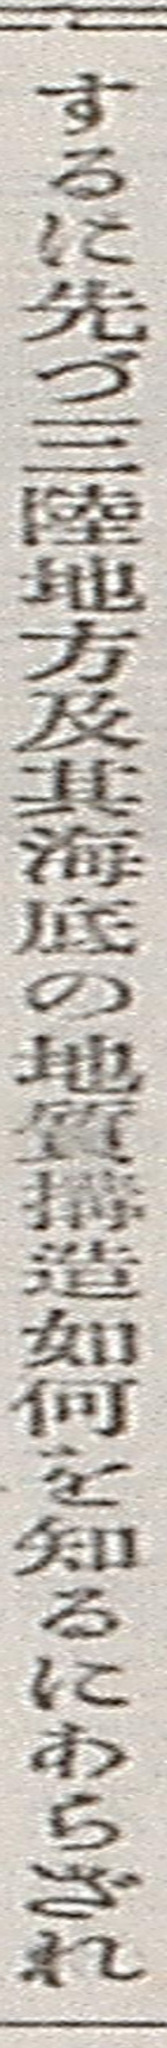するに先づ三陸地方及其海底の地質構造如何を知るにあらざれ
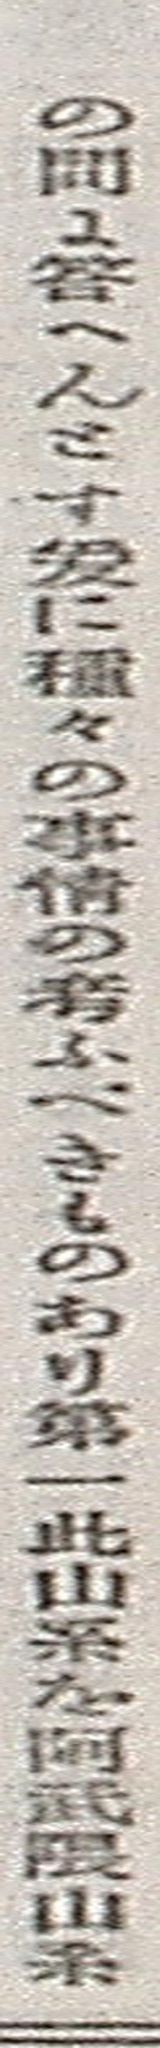の問に答へんとす爰に種々の事情の考ふべきものあり第一此山系を阿武隈山系
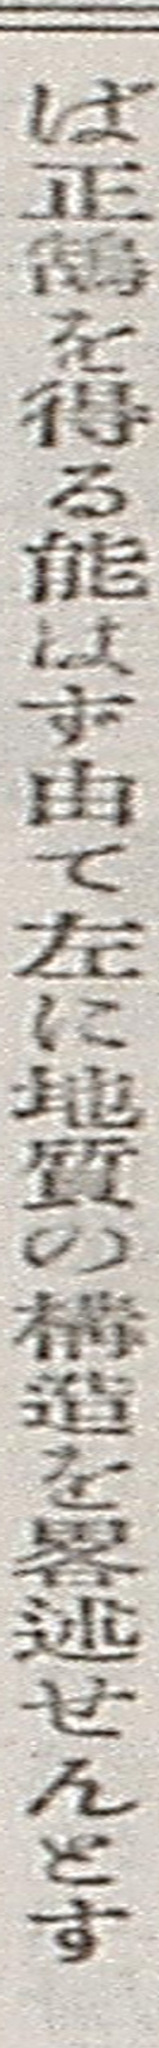ば正鵠を得る能はず由て左に地質の構造を略述せんとす
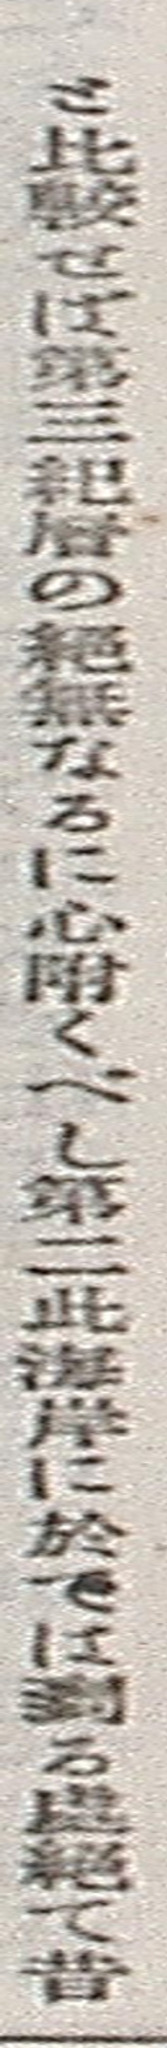と比較せば第三紀層の絶無なるに心付くべし第二此海岸に於ては到る処絶て昔
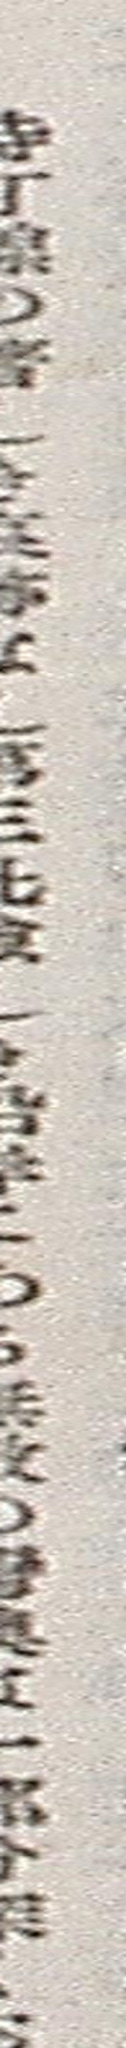時汀線の著しき痕跡なし第三此険しき沿岸にある無数の湾澳は一部分深く内地
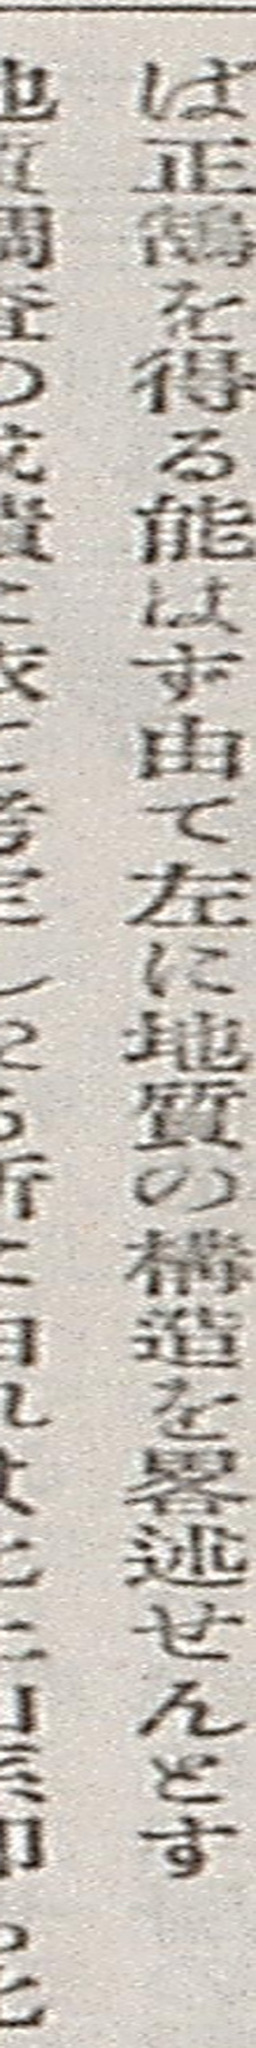地質調査の成績に依て考定したる所に由れは北上山系即ち北上
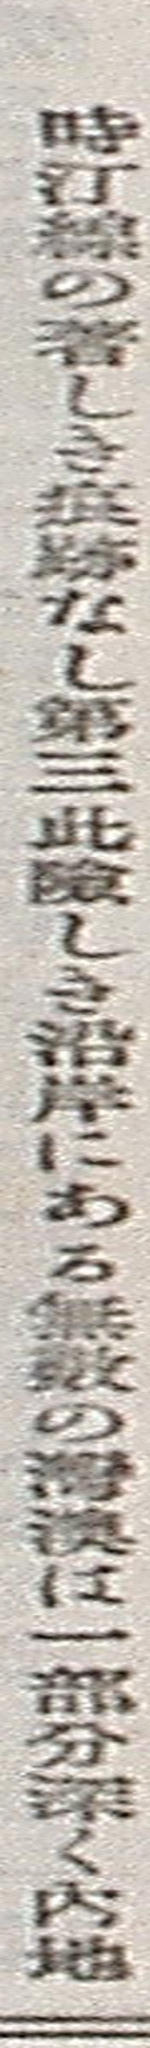時汀線の著しき痕跡なし第三此険しき沿岸にある無数の湾澳は一部分深く内地
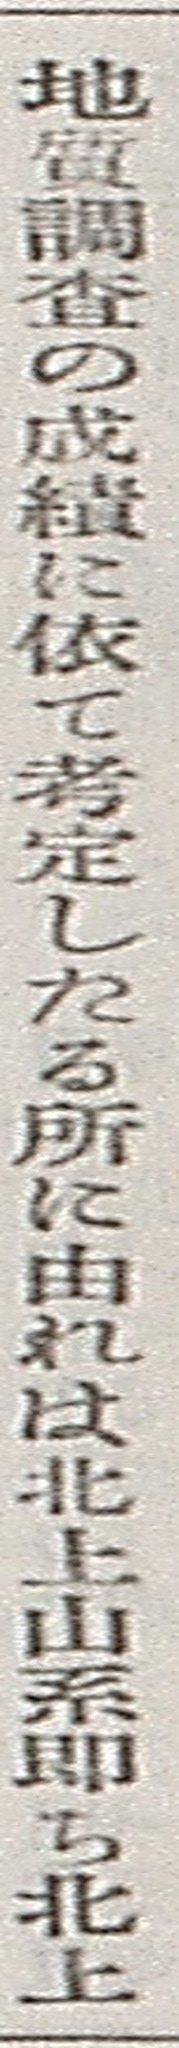地質調査の成績に依て考定したる所に由れは北上山系即ち北上
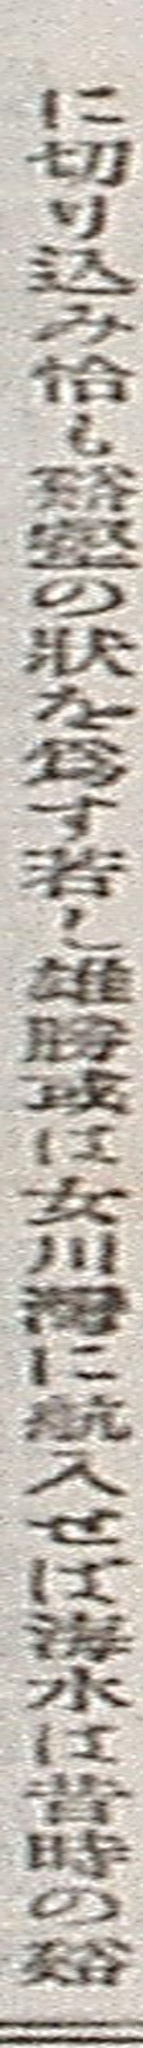に切り込み恰も谿壑の状を為す若し雄勝或は女川湾に航入せば海水は昔時の谿
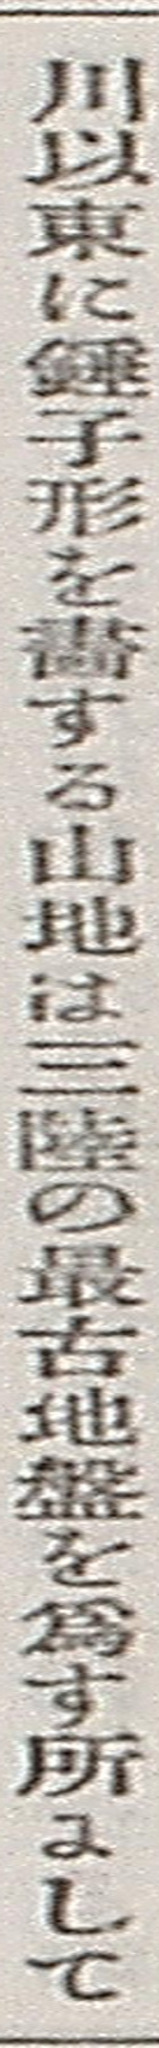川以東に錘子形を画する山地は三陸の最古地盤を為す所にして
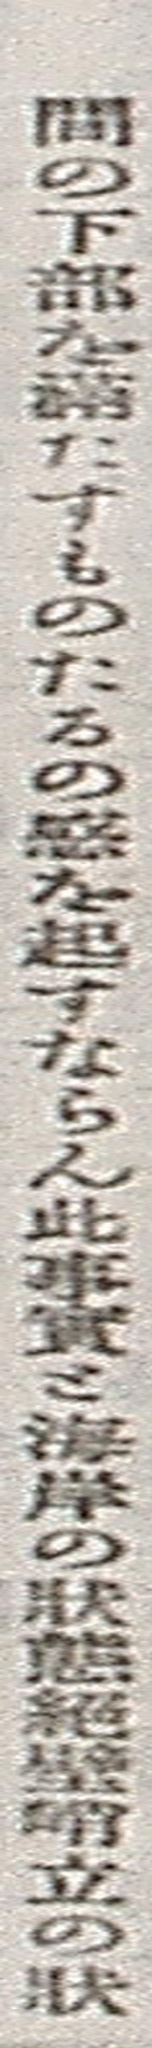間の下部を満たすものたるの感を起すならん此事実と海岸の状態絶壁峭立の状
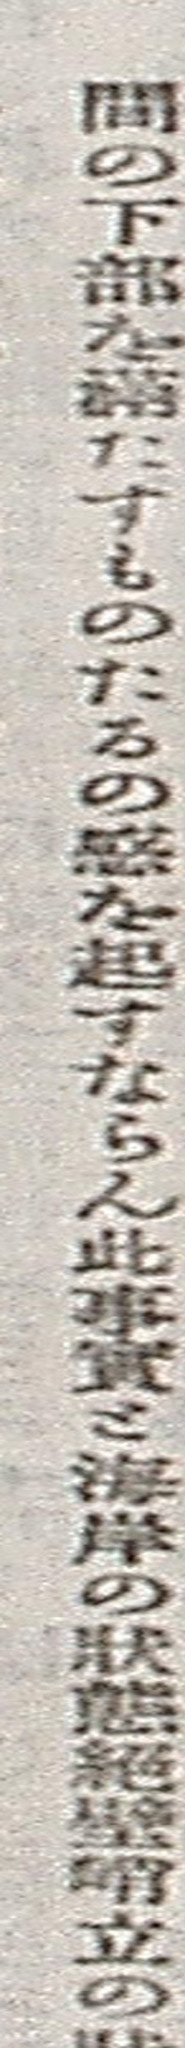間の下部を満たすものたるの感を起すならん此事実と海岸の状態絶壁峭立の状
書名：風俗畫報臨時増刊第百二十號　大海嘯被害録（下）
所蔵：東京大学地震研究所図書室 Earthquake Research Institute Library, The University of Tokyo, JAPAN
